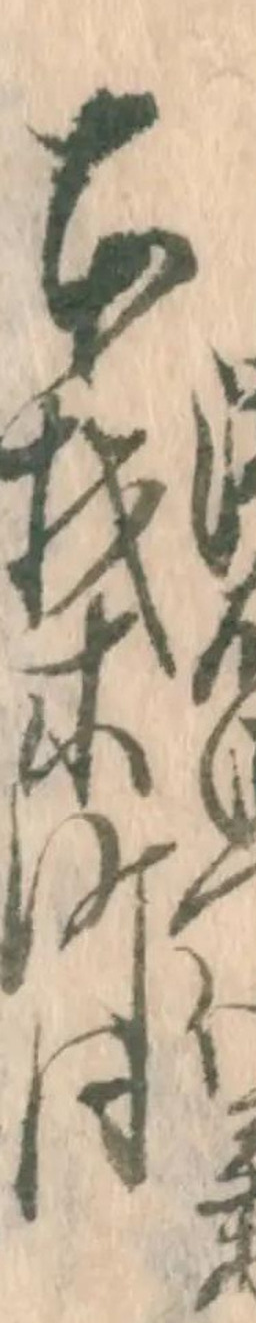本材木町同
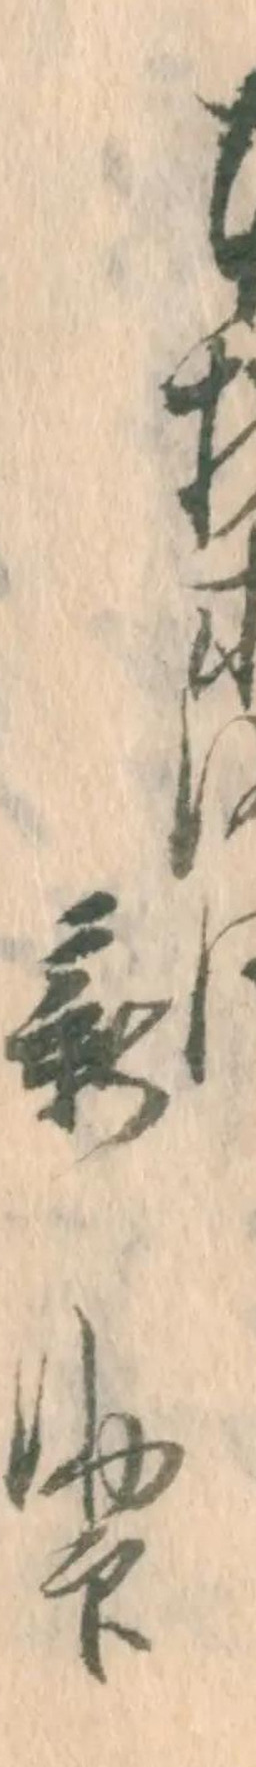新助印
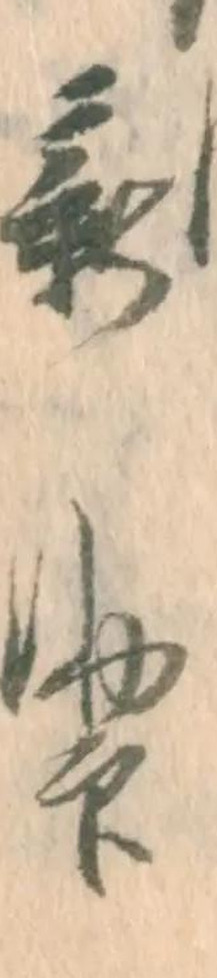新助印
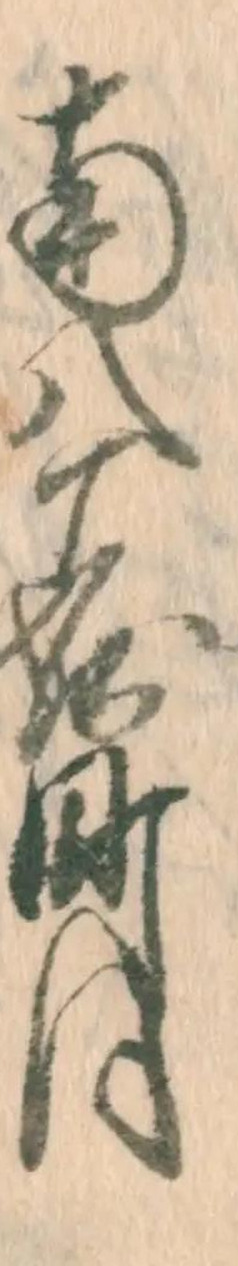南八丁堀町同
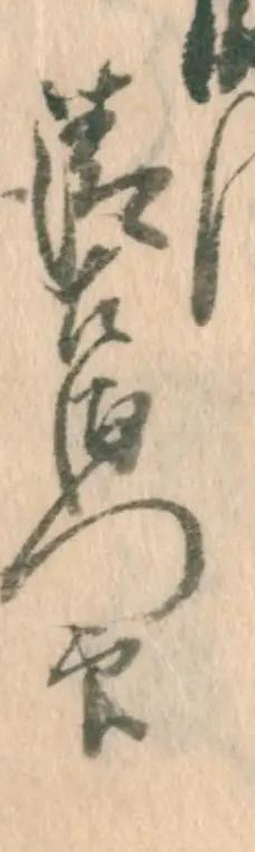清左衛門印
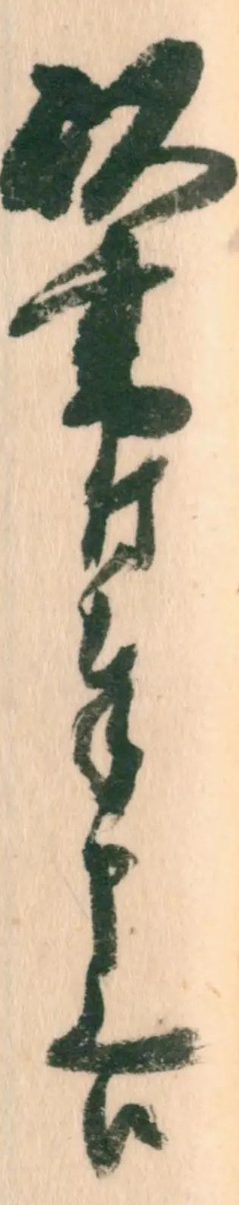以書付奉申上候
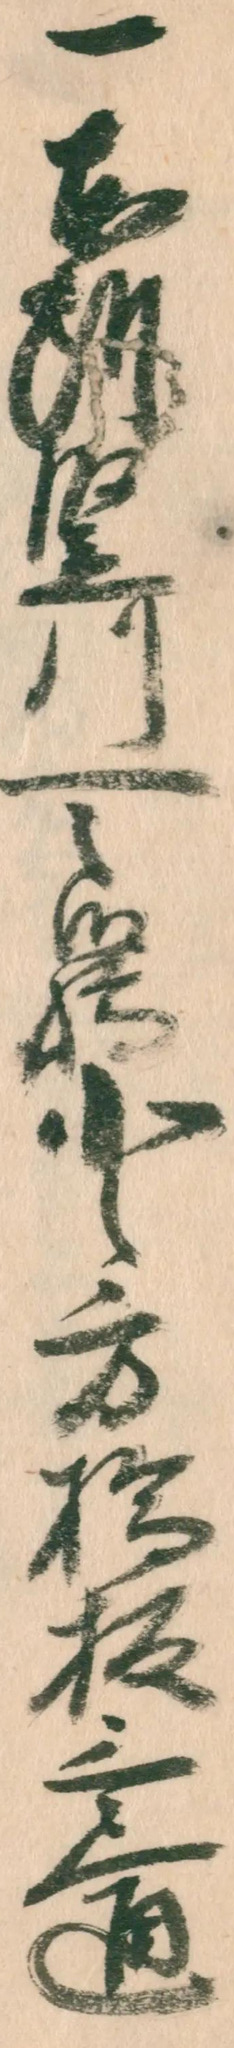一本所竪川一之御橋北之方橋板三尺通
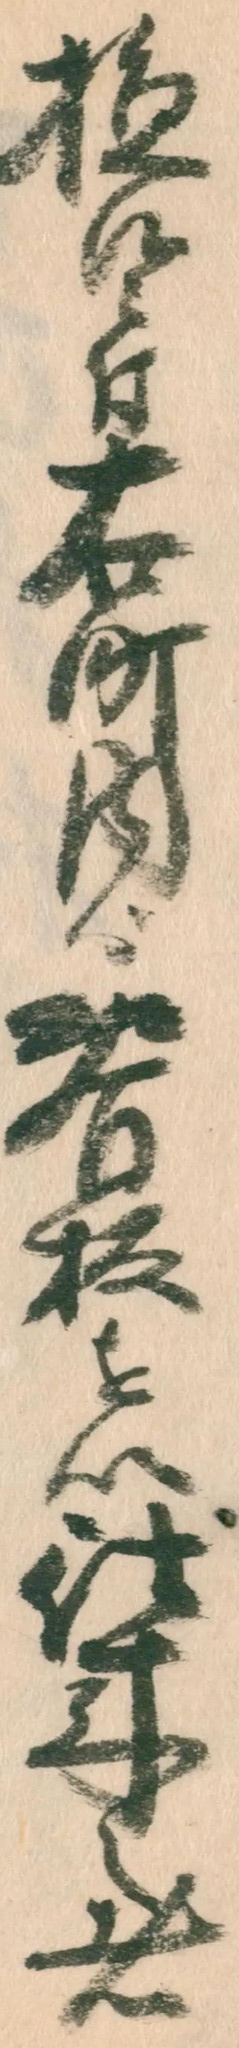損候ニ付右町内ゟ背板を以往来之者
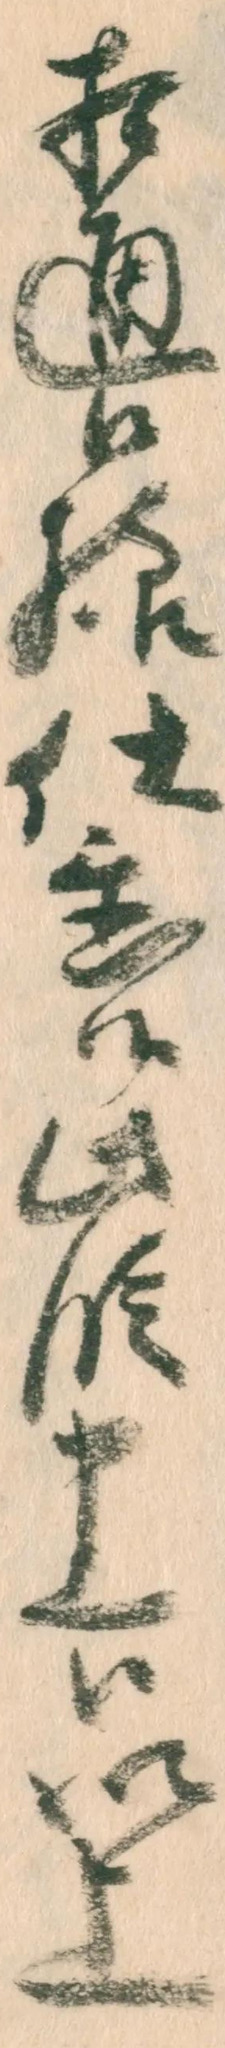相通候様仕置候此段申上候以上
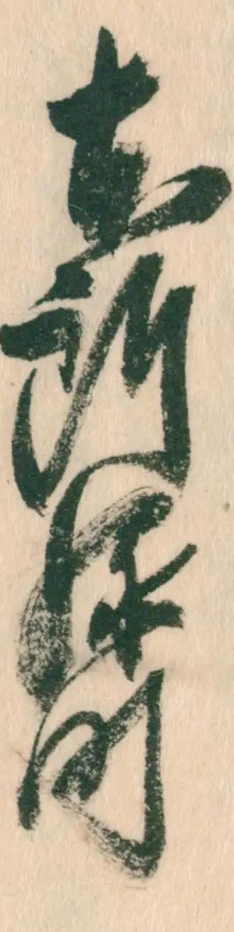本所緑町
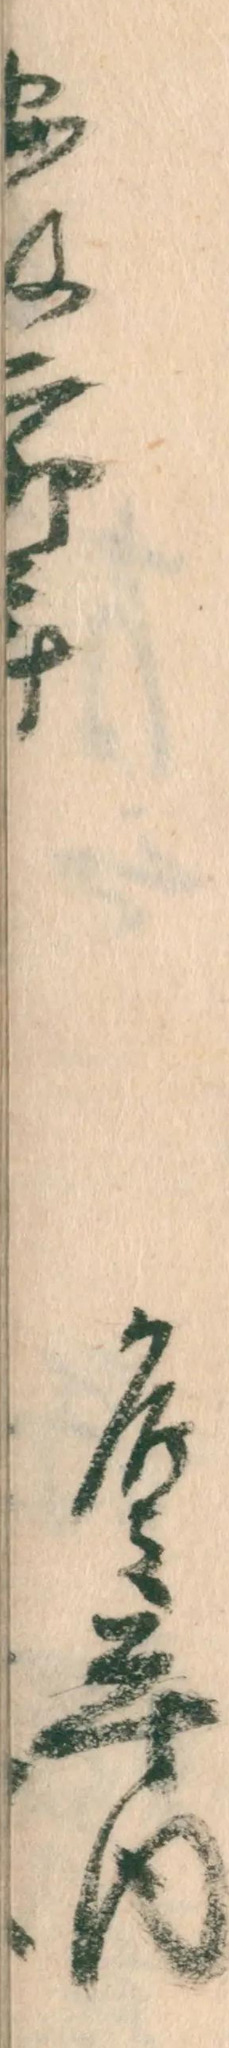安政二卯年名主平内

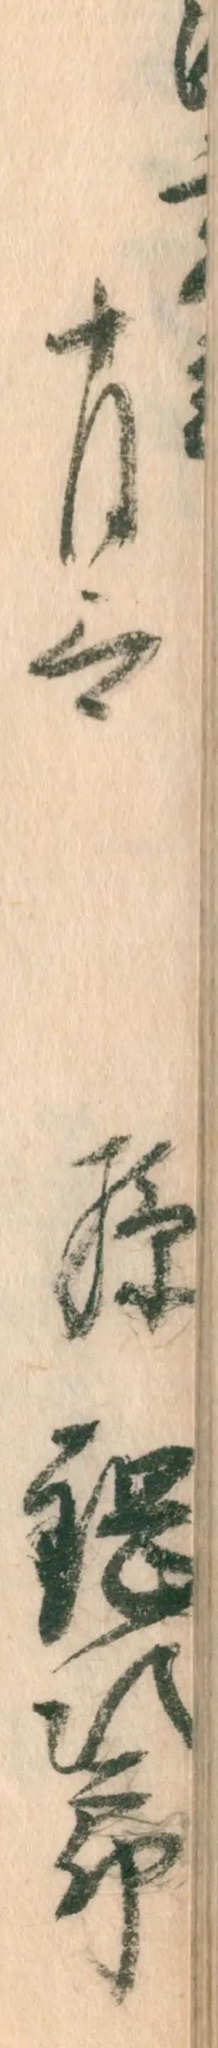十月三日孫鋼次郎
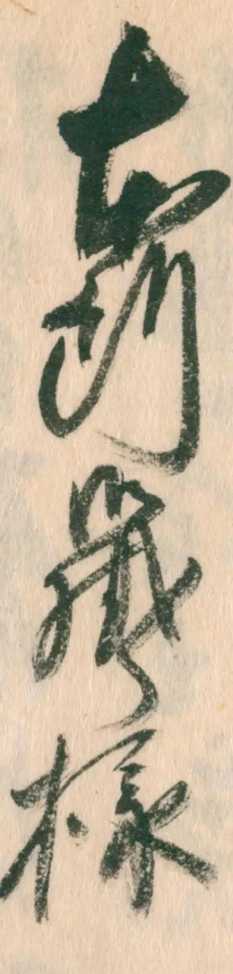本所御掛リ様
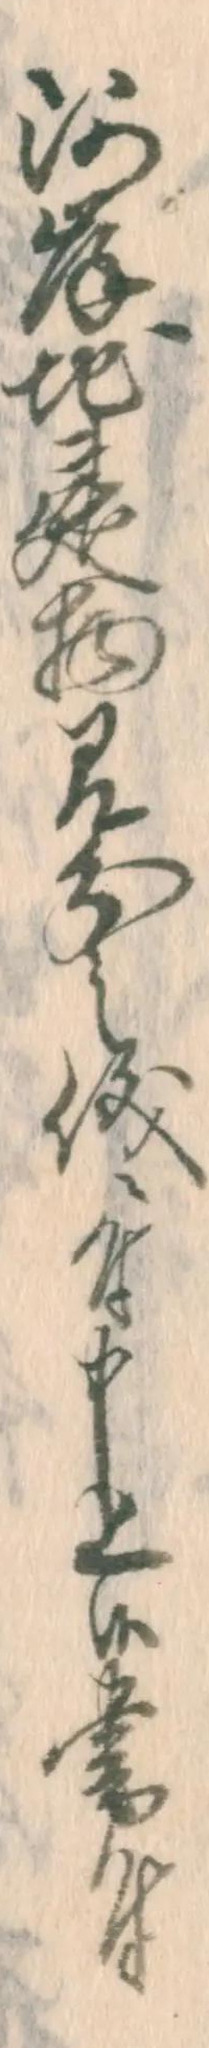│河岸地建物見分之儀ニ付申上候書付
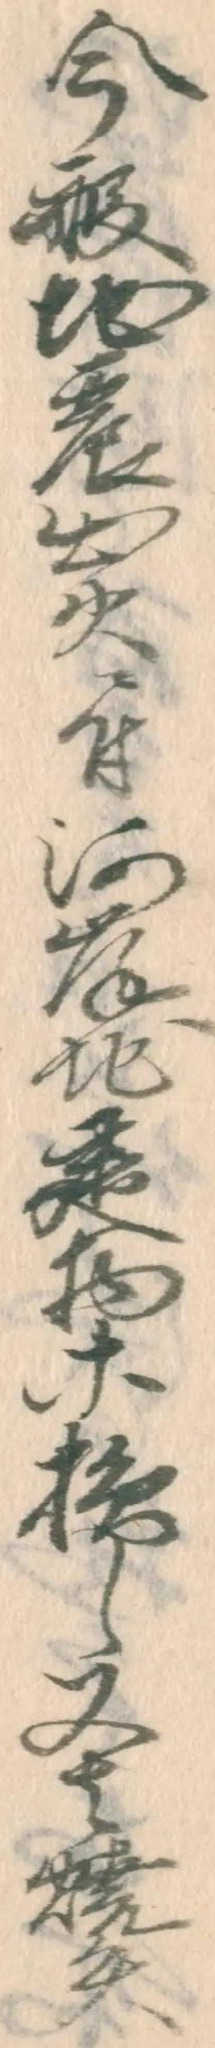今般地震出火ニ付河岸地建物等損し又は焼失
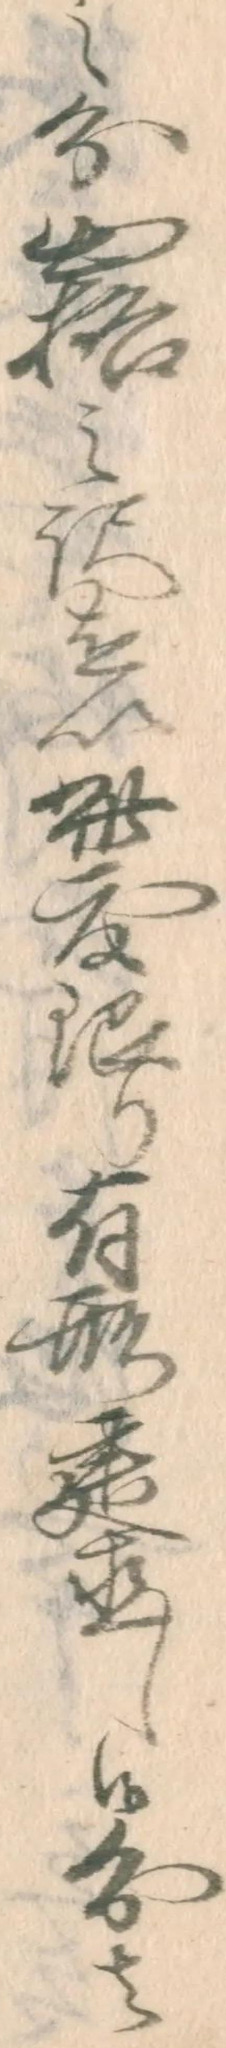之分出格之訳を以此度限リ有形建直し候分は
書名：地震災書留 2巻. [1] 内表紙に「地震災書留　安政二卯年　但本所深川御用屋敷地代免除調」とあり
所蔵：国立国会図書館 National Diet Library, JAPAN
